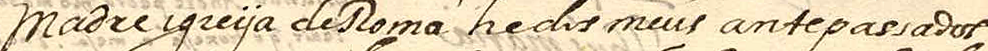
madre igreija de Roma he dos meus antepassados
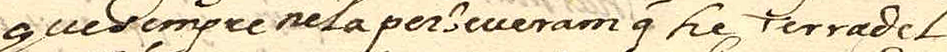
que sempre nela perzeueram q̄ he terra del
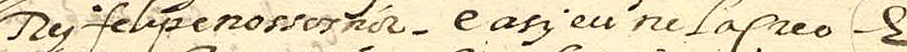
Rej felipe nosso snōr- e asy eu nela Creo E
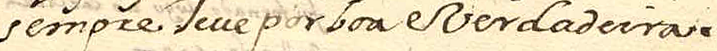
sempre Teue por boa e verdadeira.
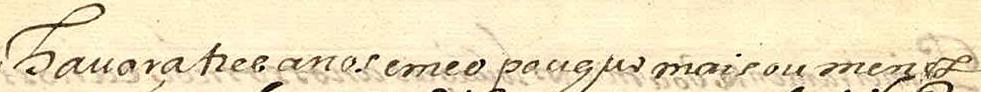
hauara tres anos e meo pouquo mais ou menos
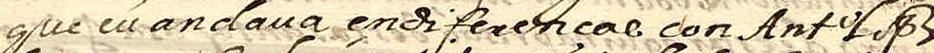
que eu andaua en diferençae con Anto Lopz̄
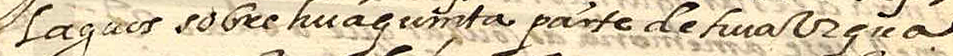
Laguos sobre huā quinta parte de hua urqua
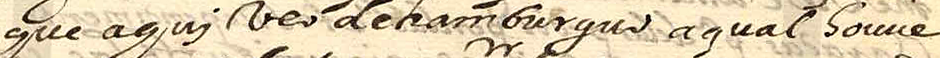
que aquj veo de hamburguo a qual houue
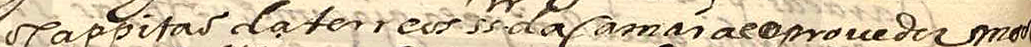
o Cappitaõ da terre os ssrr. da Camara e o prouedor moo
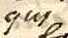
qui
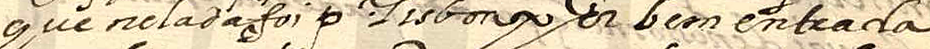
que nela da foi pa. Lisbon por bem entrada
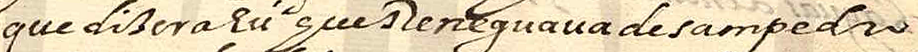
que dizera hū que Reneguaua de sam pedro
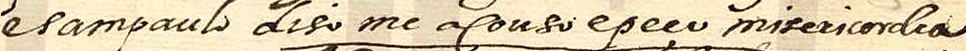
e sam paulo diso me aCouso e peço misericordia
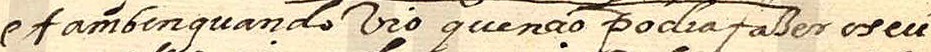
e tamben quando Vio que naõ podia fazer o seu
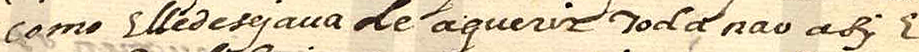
como Elle desejaua de aquerir Toda nao asy E
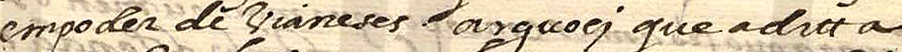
em poder de Vianeses arguoej que a ditta
